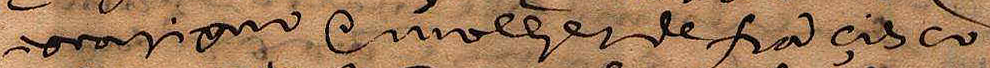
escariguo e molher de frāçisco
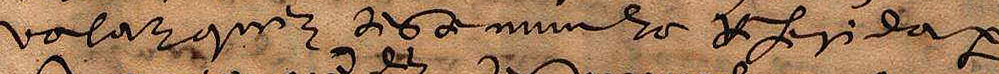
valazquez testemunha Referida ꝑ
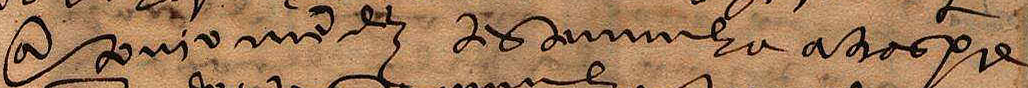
ātonio mēdez testemunha atras pre
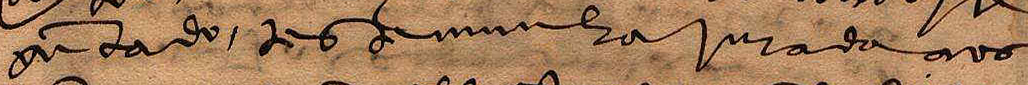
gūtado / testemunha Jurada aos
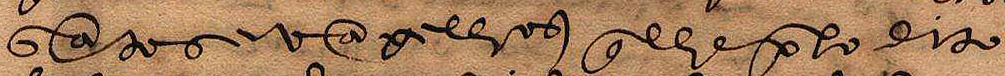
sātos evāgelhos q̄ lhe p̄lo dito
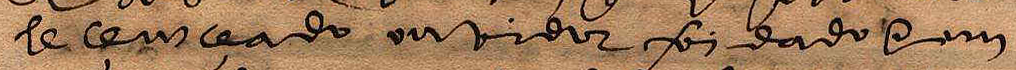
leçemçeado ouvidor foi dado e em
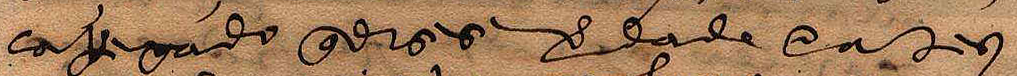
caRegado q̄ disese ꝟdade e a tes
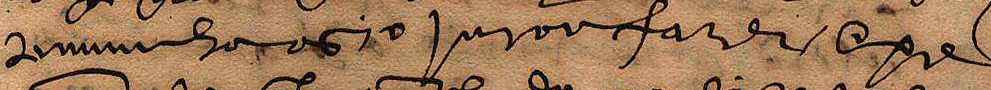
temunha asi o Jurou fazer / e pre
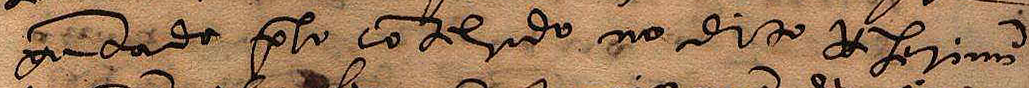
gūtada p̄lo cōtehudo no dito Referimē
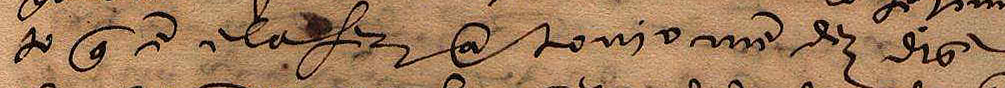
to q̄ ē ela fez ātonjo mēdez dise
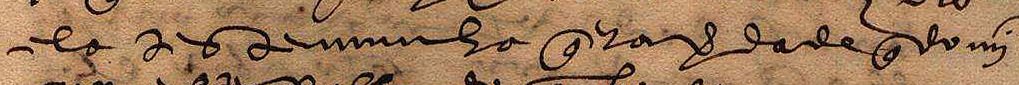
ela testemunha q̄ era ꝟdade q̄ domj̄
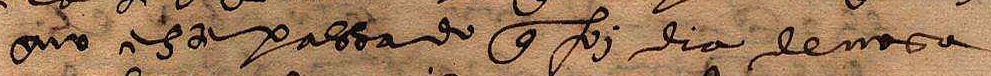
guo este passado q̄ foj dia de nosa
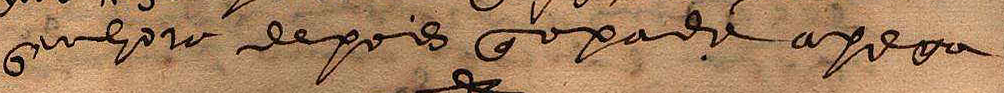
senhora depois q̄ o padre a prega
